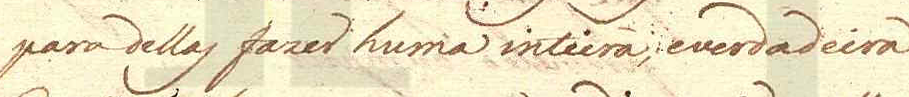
para dellas fazer huma inteira; e verdadeira
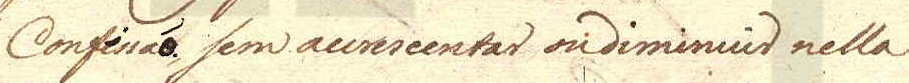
Confissaõ, sem accrescentar ou diminuir nella
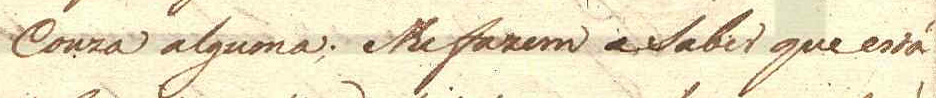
Couza alguma; e lhe fazem a Saber que está
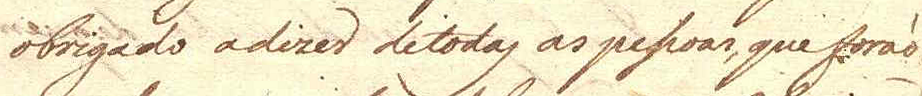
obrigado a dizer de todas as pessoas, que foraõ
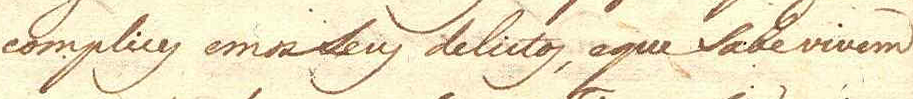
complices em os Seus delictos, e que Sabe vivem
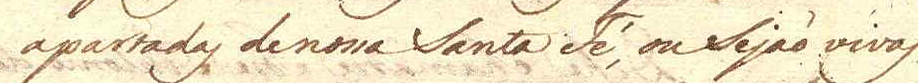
apartadas de nossa Santa Sé, ou Sejaõ vivas,
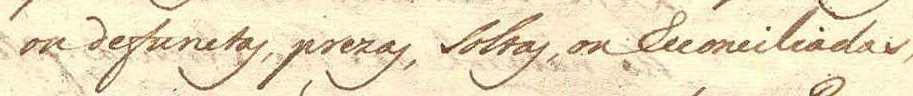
ou defunctas, prezas, soltas, ou Reconciliadas,
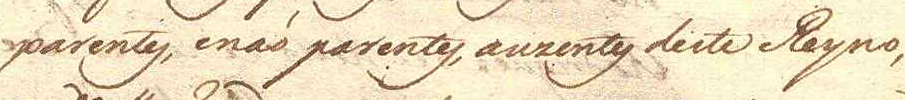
parentes, e naõ parentes, auzentes deste Reyno,
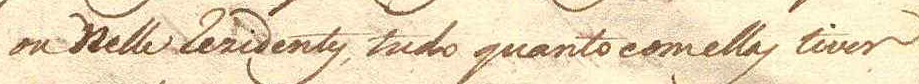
ou nelle Rezidentes, tudo quanto com ellas tiver
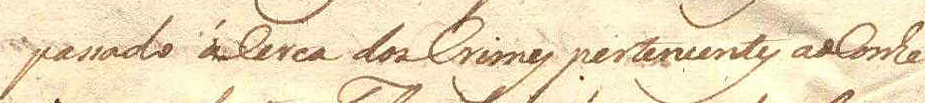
passado àCerca dos Crimes pertencentes ao Conhe
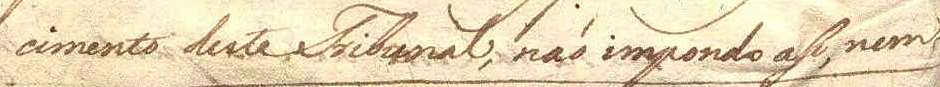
cimento deste Tribunal, naõ impondo a si, nem
